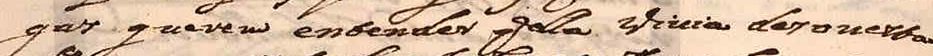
gas querem entender q̄ ella viuia desonesta
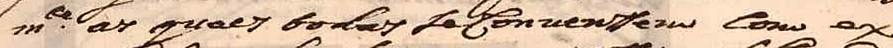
m.te as quaes todas se Conuenssem com ex
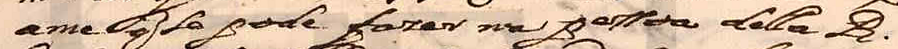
ame q̄ se pode fazer na pessoa della R.
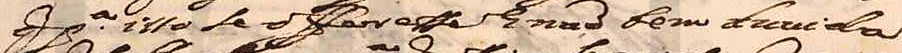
q̄ p.a isso se offeresse, E naõ tem duuida
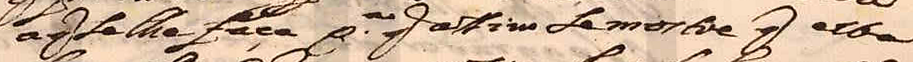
a q̄ se lhe faça p.a q̄ asim se mostre q̄ esta
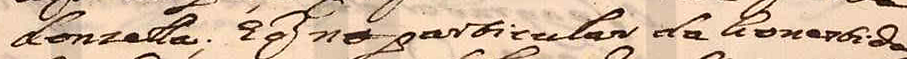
donzella; E q̄ no particular da honestida
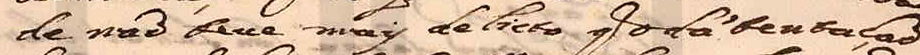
de naõ teue mais delicto q̄ o da tentaçaõ
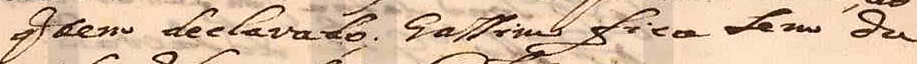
q̄ tem declarado. E assim fica sem du
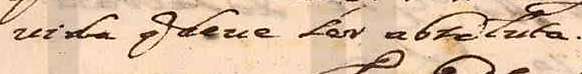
uida q̄ deue ser absoluta.
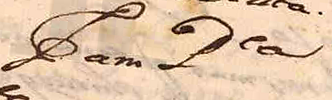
Fam Pca
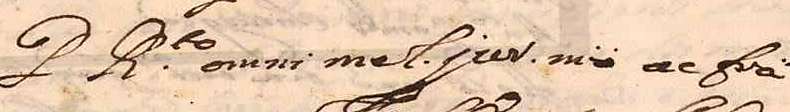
P R.to omni mel. jur. mō ac frā
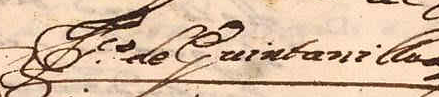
fr.co de Quintanilha
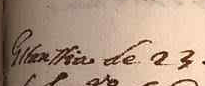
Estanssia de 23.
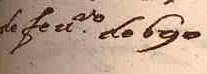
de feuro de 690
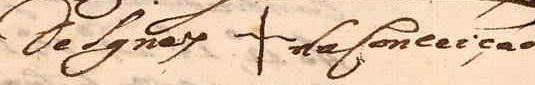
de Ignes + da Conceiçaõ
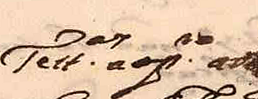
Test.as ao p.ro ar
